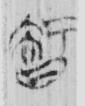智
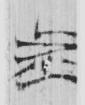者
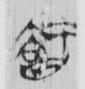智
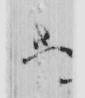之
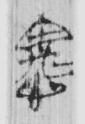愚
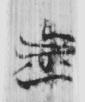者
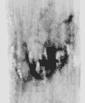曰
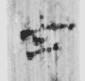才
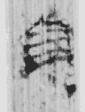命
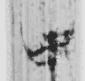曰
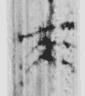夫
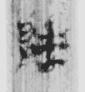邦
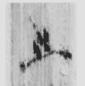之
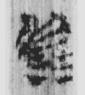溺
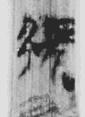張
